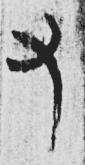又（有）
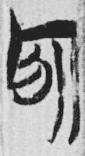所
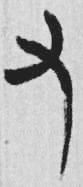又（有）
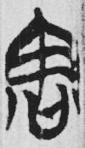○（餘）
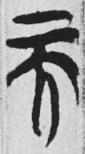而
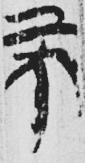不
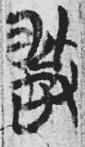敢
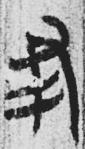○（盡）
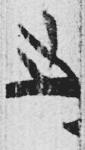之
